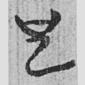也
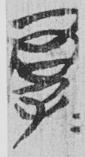君子
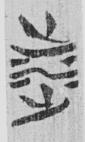涉
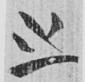之
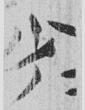小人
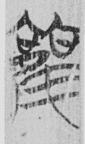雚（觀）
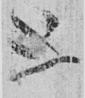之
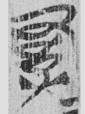君子
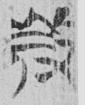敬
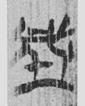城
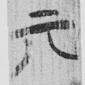亓（其）
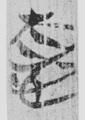惪（德）
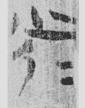小人
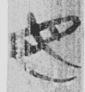母
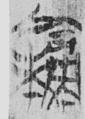○（寐）
